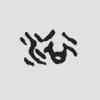浴
